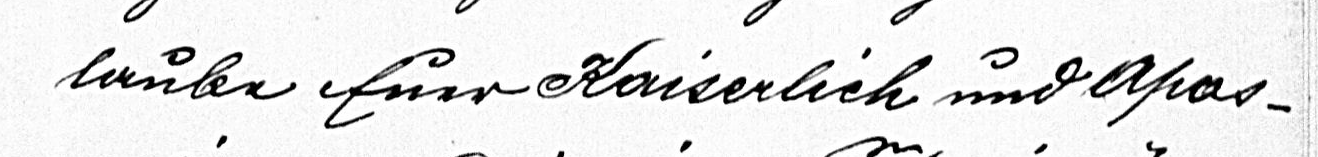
laube Euer Kaiserlich und Apos¬
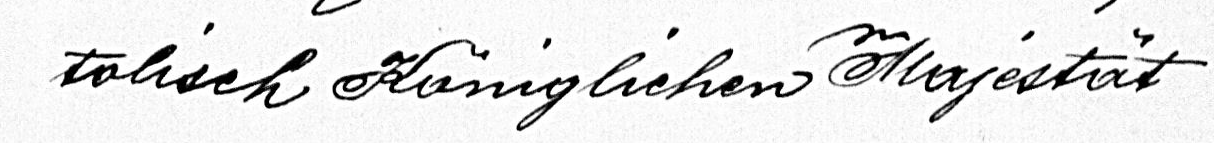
tolisch Königlichen Majestät
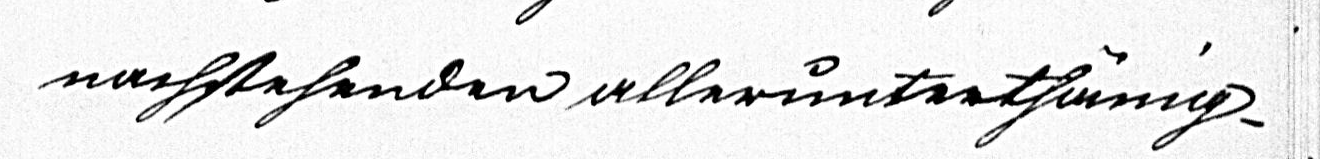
nachstehenden allerunterthänig¬
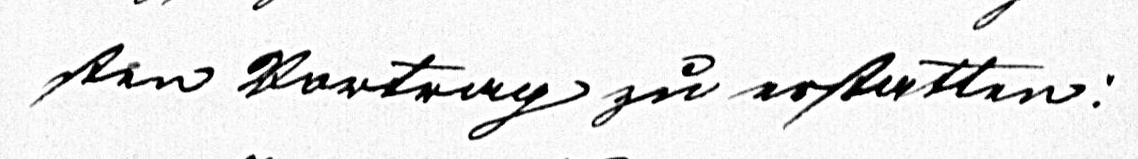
sten Vortrag zu erstatten:
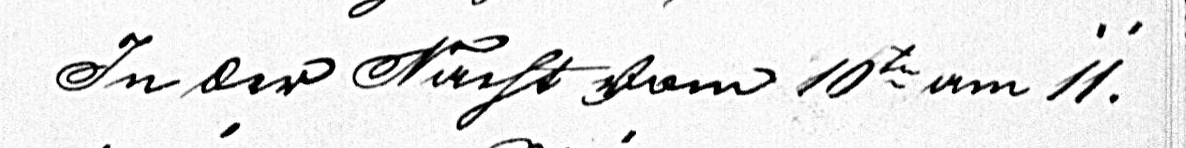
In der Nacht vom 10te am 11.
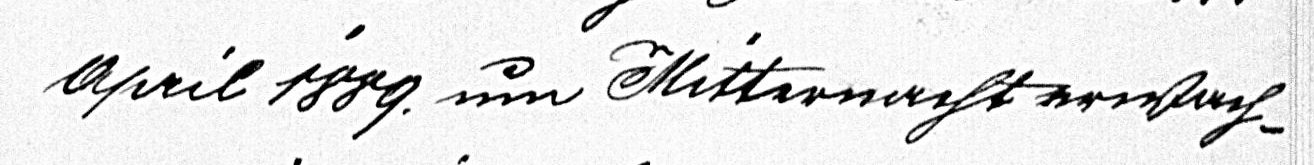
April 1889. um Mitternacht erwach¬
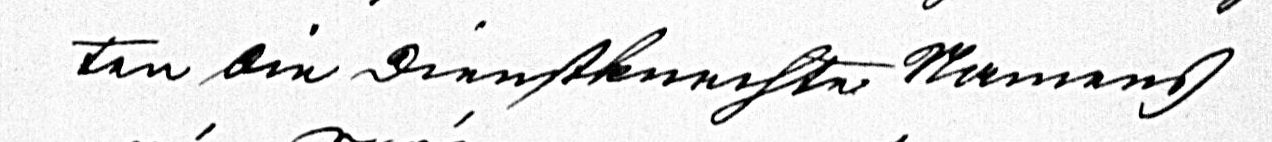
ten die Dienstknechte Namens
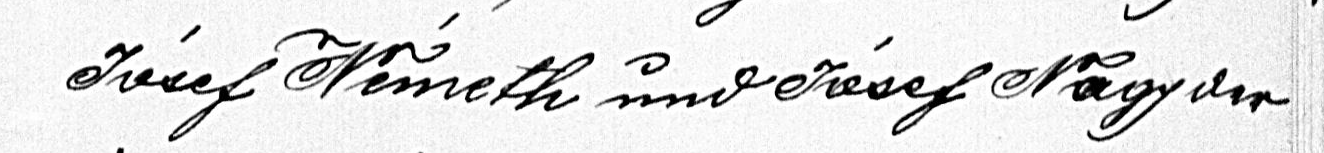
Jósef Ńemeth und Jósef Nagy der
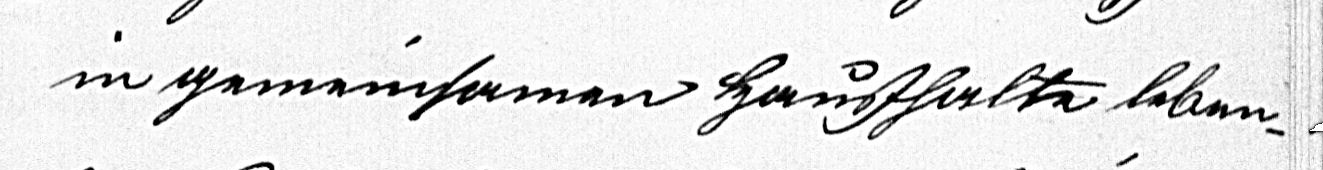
in gemeinsamen Hausthalte leben¬
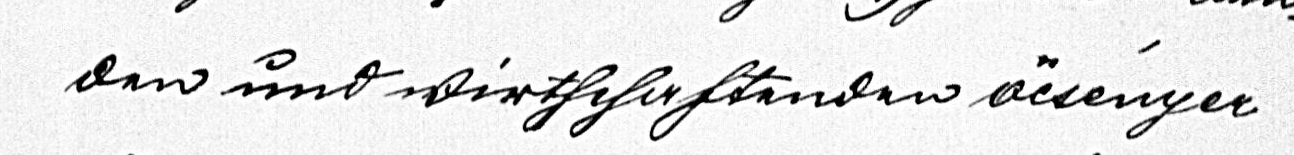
den und wirthchaftenden öcsényer
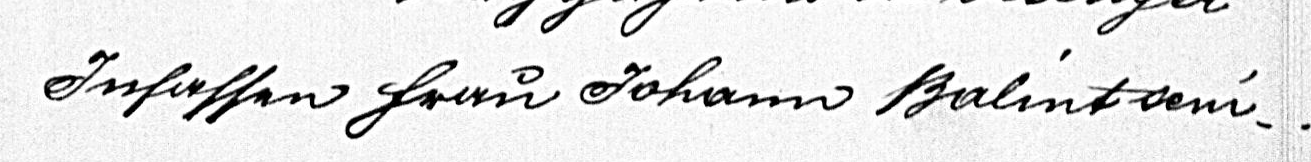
Insassen Frau Johann Balintseni¬
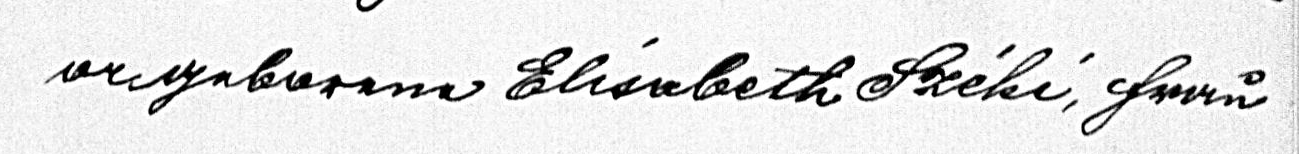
orgeborene Elisabeth Széki, Frau
